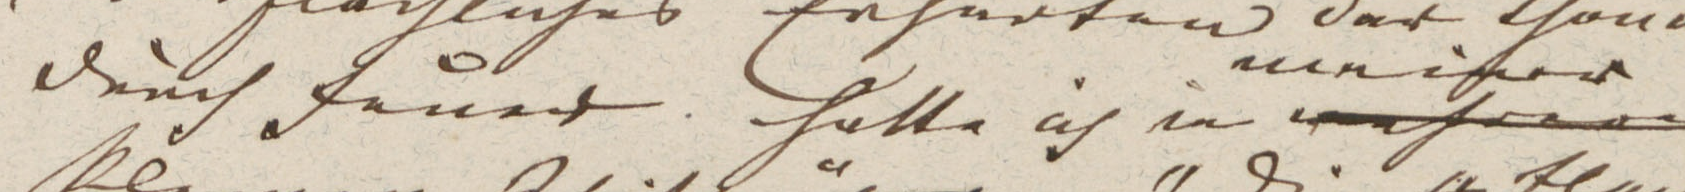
durch Feuer hatte ich in mehreren meiner
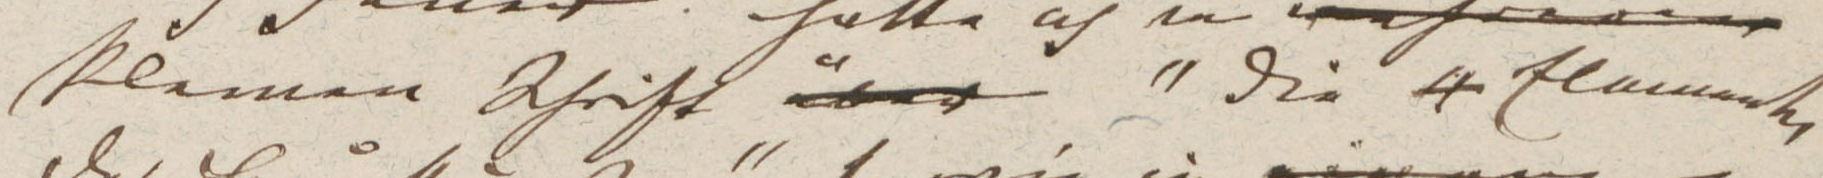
kleinen Schrift über "die 4 Elemente
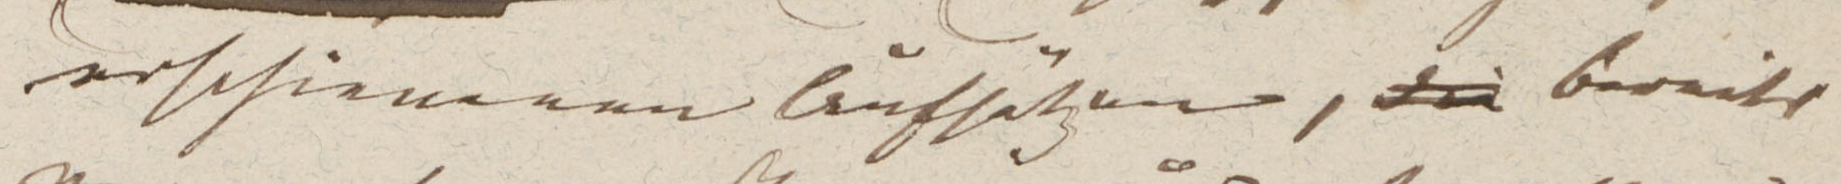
erschienenen Aufsätzen, die bereits
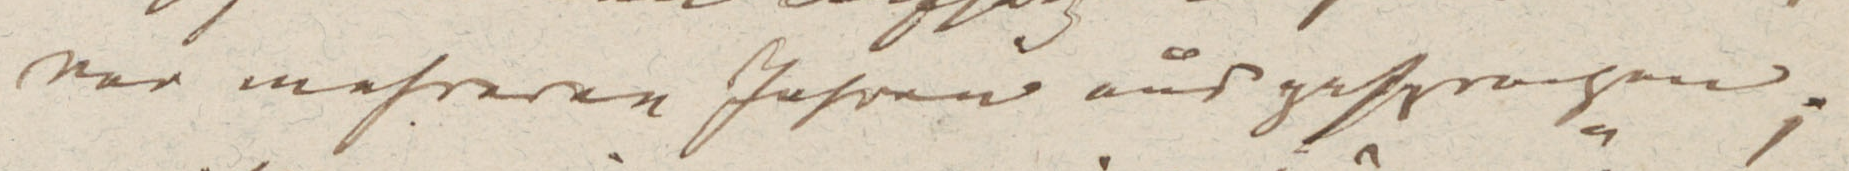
vor mehreren Jahren gesprochen;
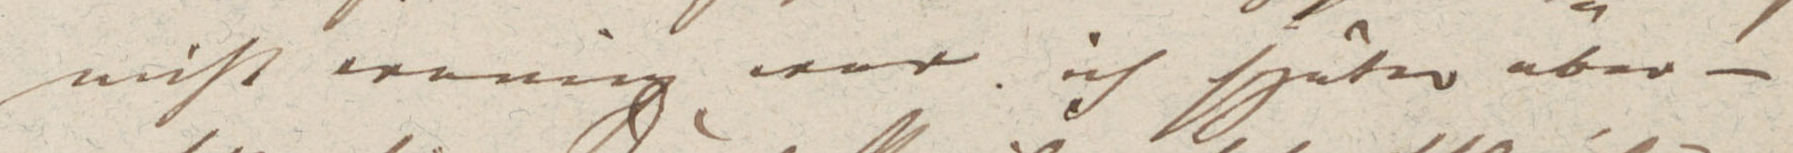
nicht wenig war ich später über-
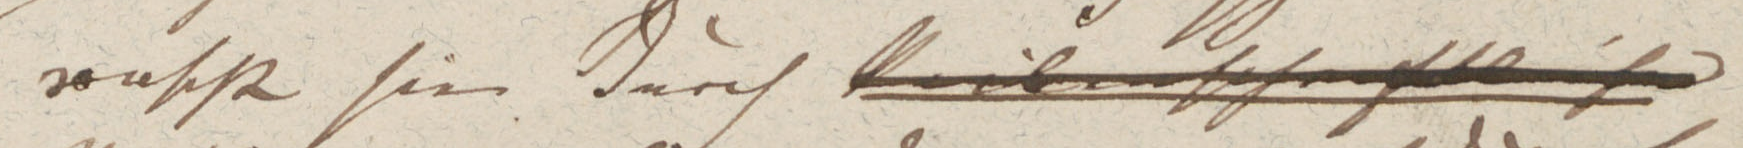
rascht sie durch keilinschriftliche
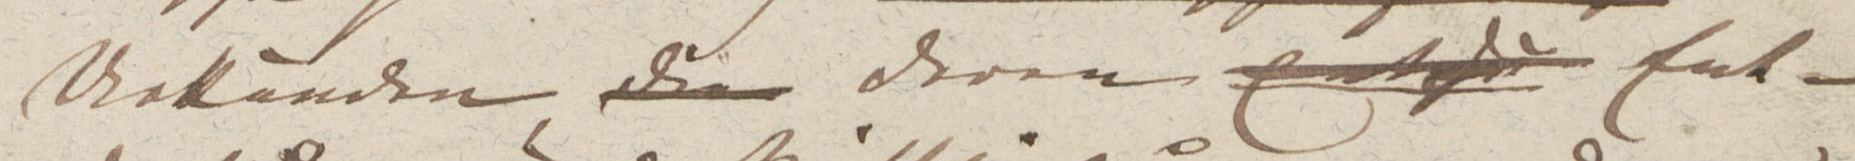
Urkunden, die deren Entd Ent-
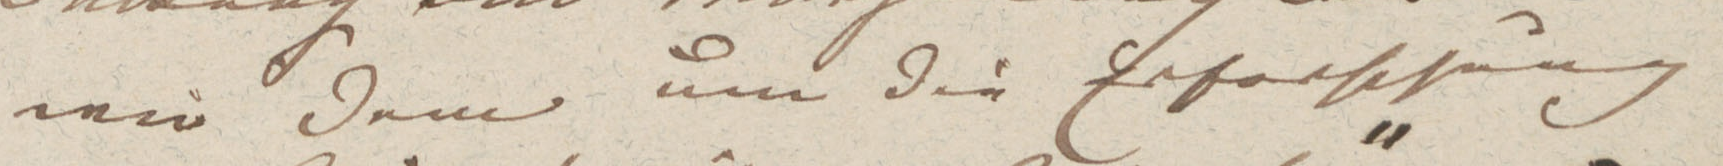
wir dem um die Erforschung
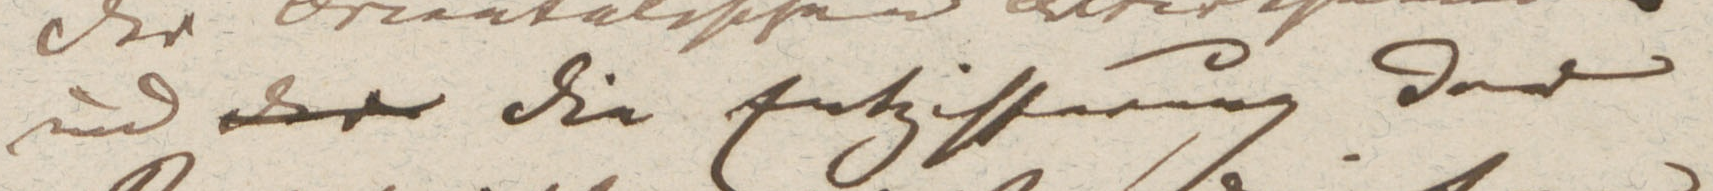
und der die Entzifferung der
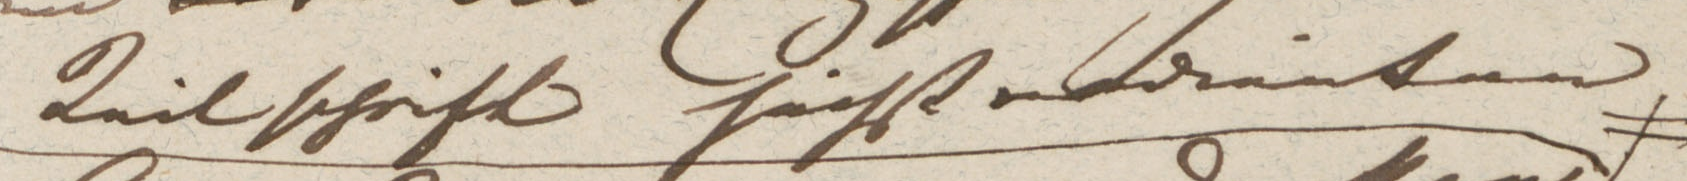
Keilschrift höchst verdienten
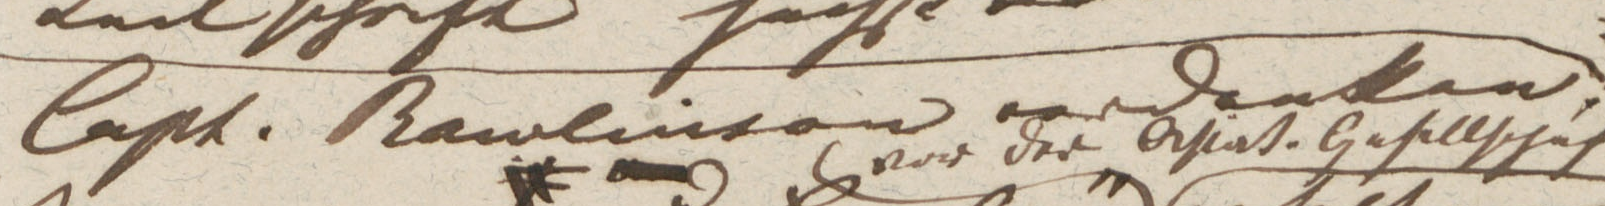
Capt. Rawlinson verdanken, %%
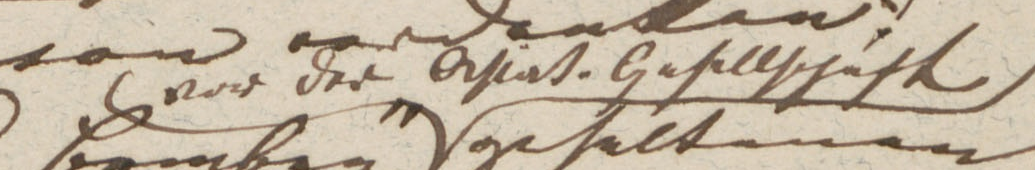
vor der Asiat. Gesellschaft
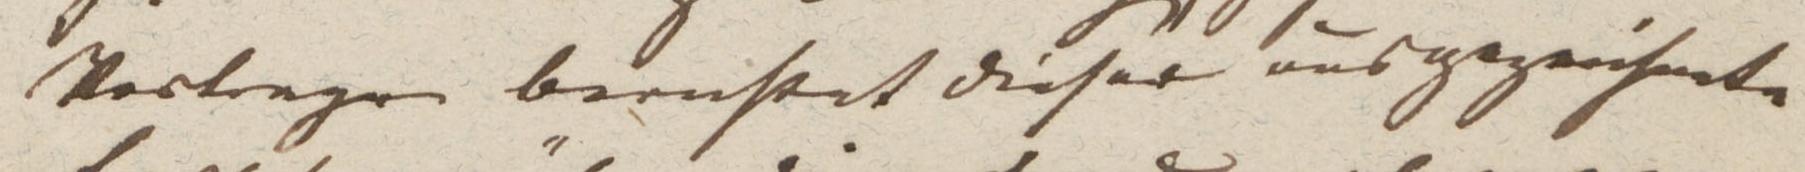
Vortrage berichtet dieser ausgezeichnete
